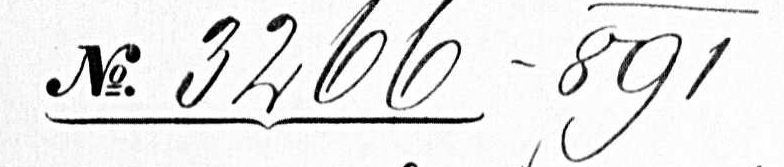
No. 3266 - 1891
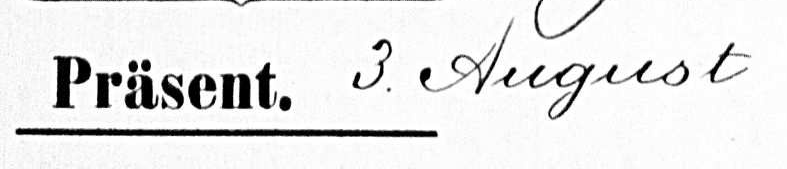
Präsent. 3. August
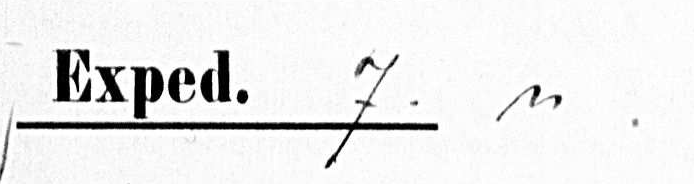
Exped. 7. „
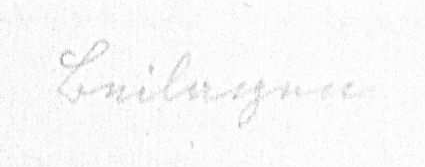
Beilagen
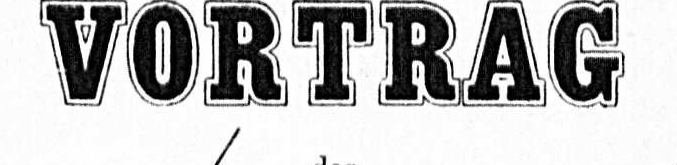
VORTRAG
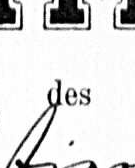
des
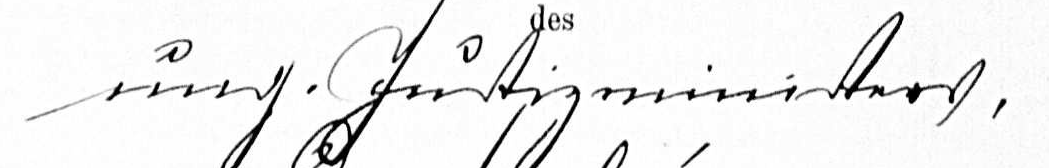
ung. Justizministers
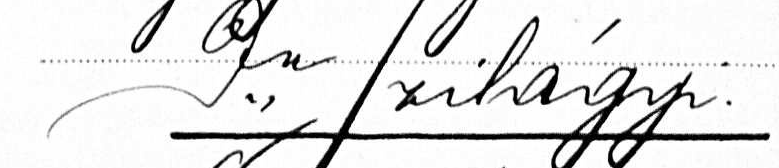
Dr Szilágyi
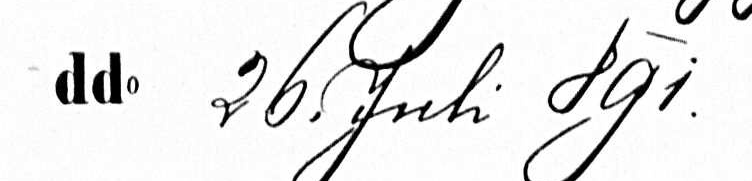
ddo 26. Juli 1891
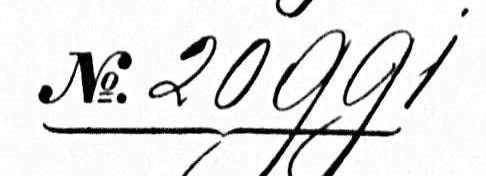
No. 20991
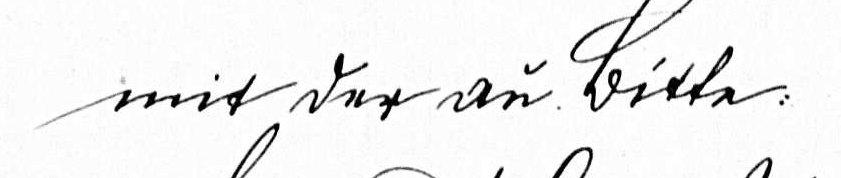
mit der au. Bitte:
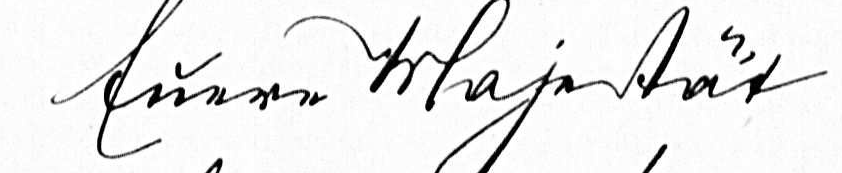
Euere Majestät
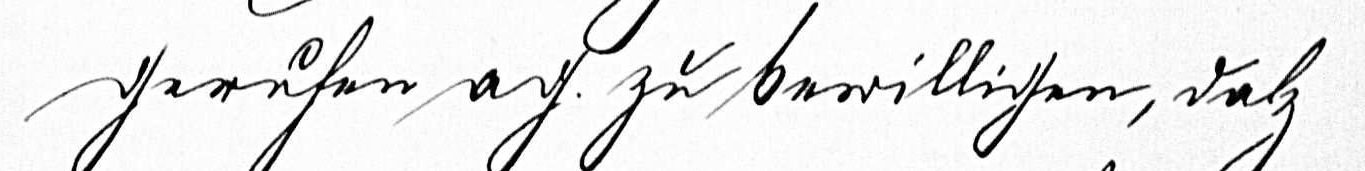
geruhen ag. zu bewilligen, daß
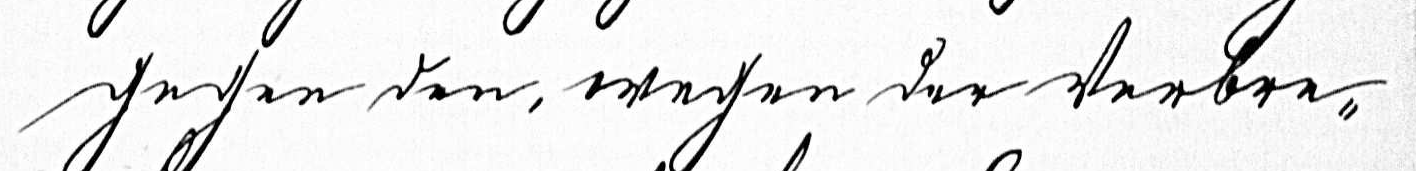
gegen den, wegen der Verbre¬
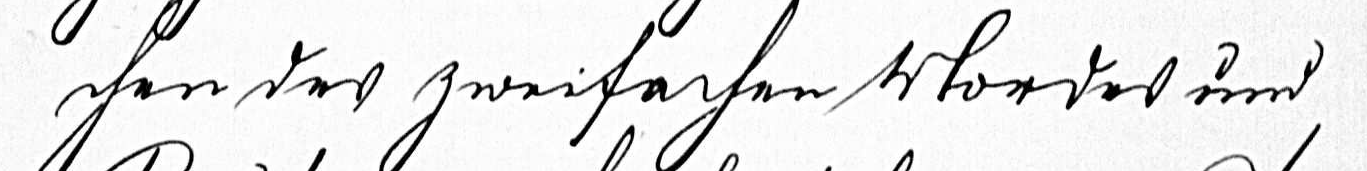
chen des zweifachen Mordes und
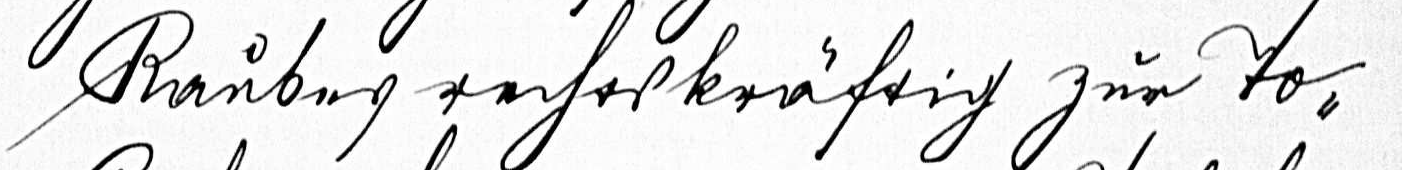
Raubes rechtskräftig zur To¬
